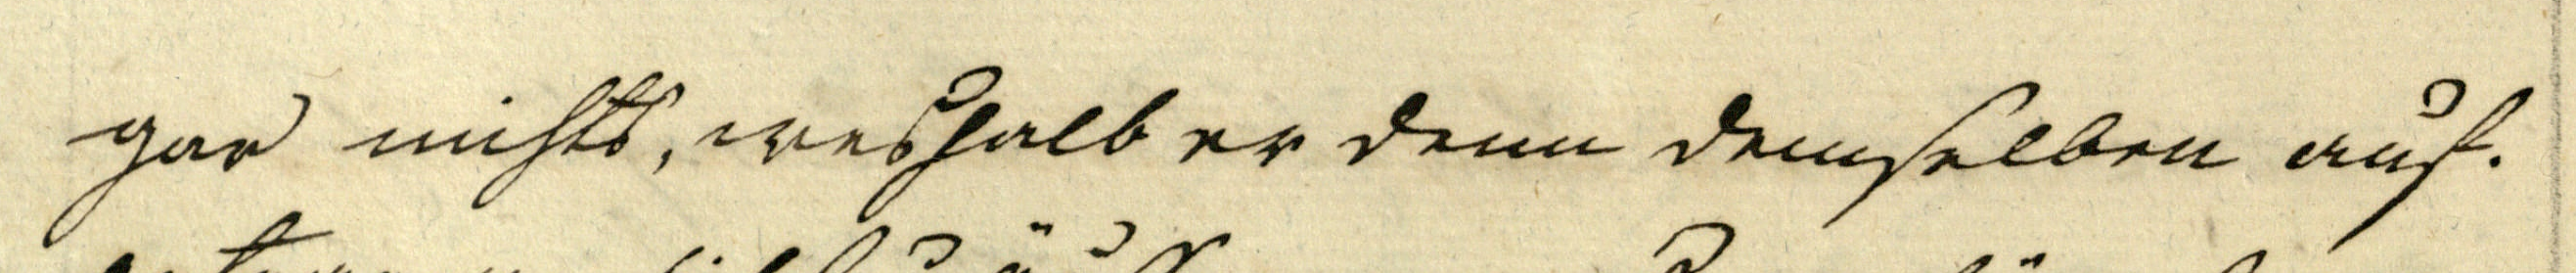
gar nichts, weshalb er denn demselben auf¬
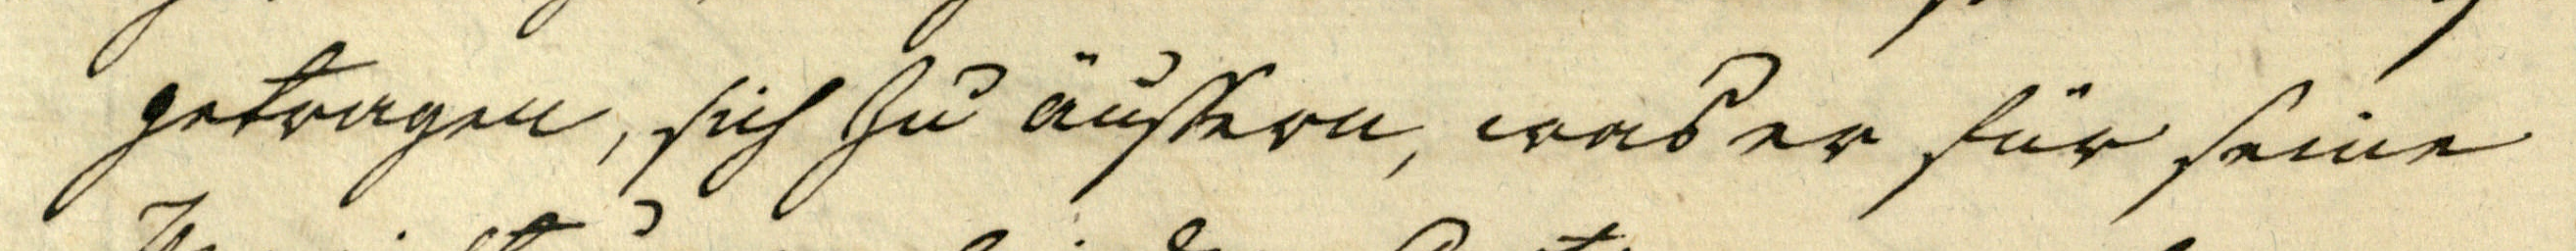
getragen, sich zu äussern, was er für seine
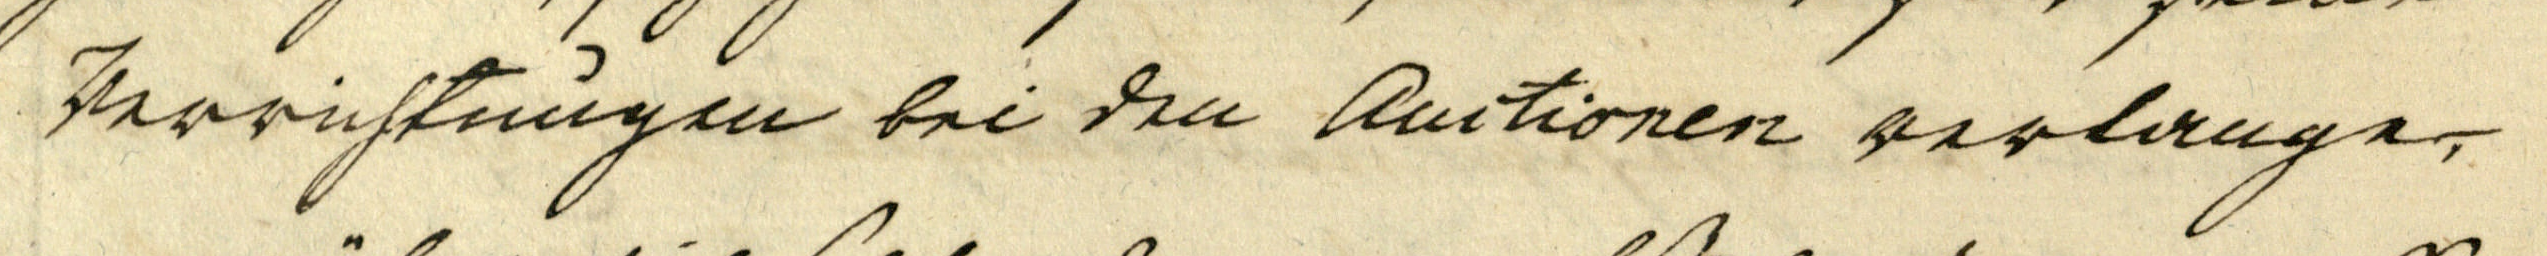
Verrichtungen bei den Auctionen verlange,
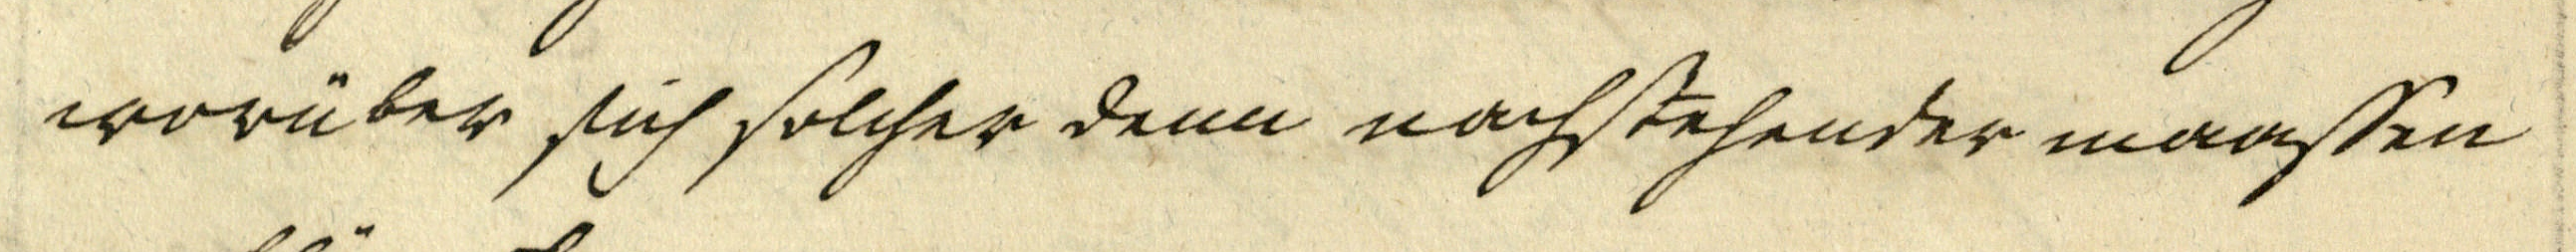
worüber sich solcher denn nachstehender maassen
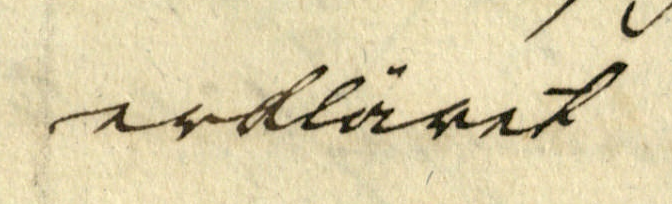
erkläret
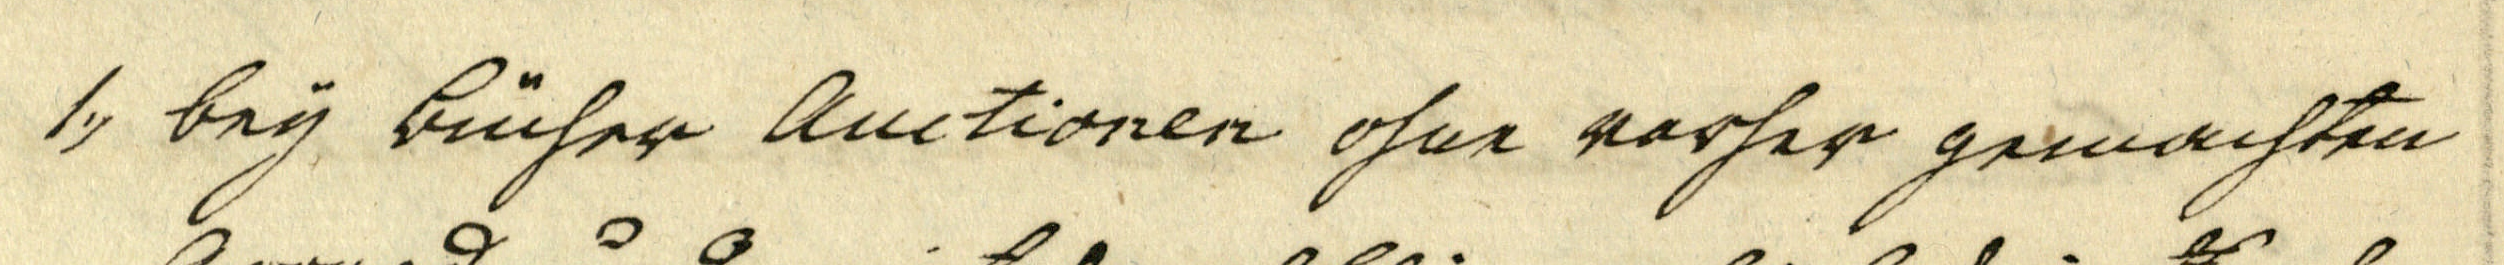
1., beÿ Bücher Auctionen ohne vorher gemachten
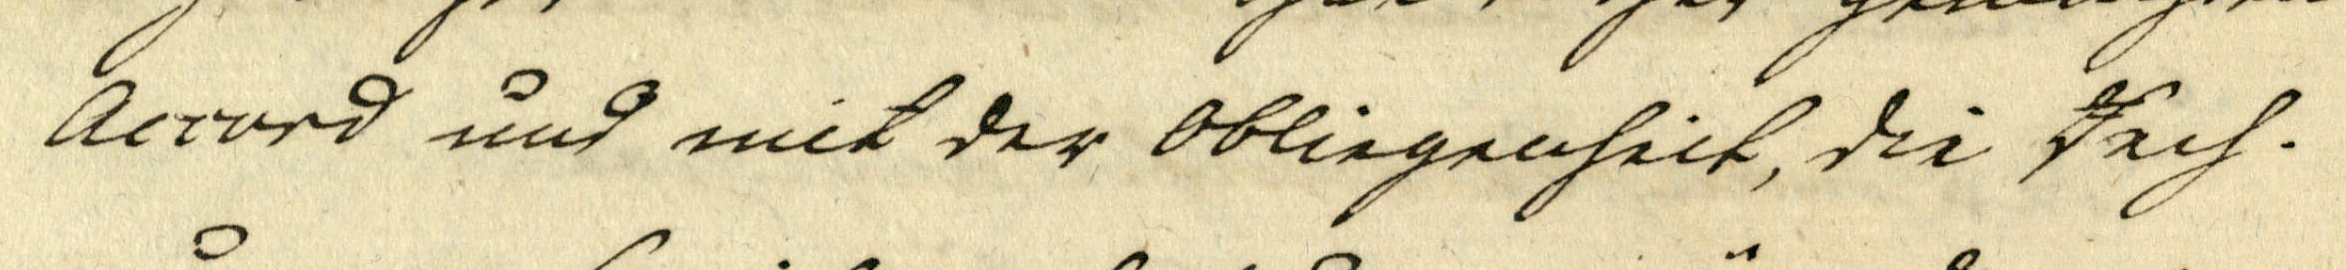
Accord und mit der Obliegenheit, die Rech¬
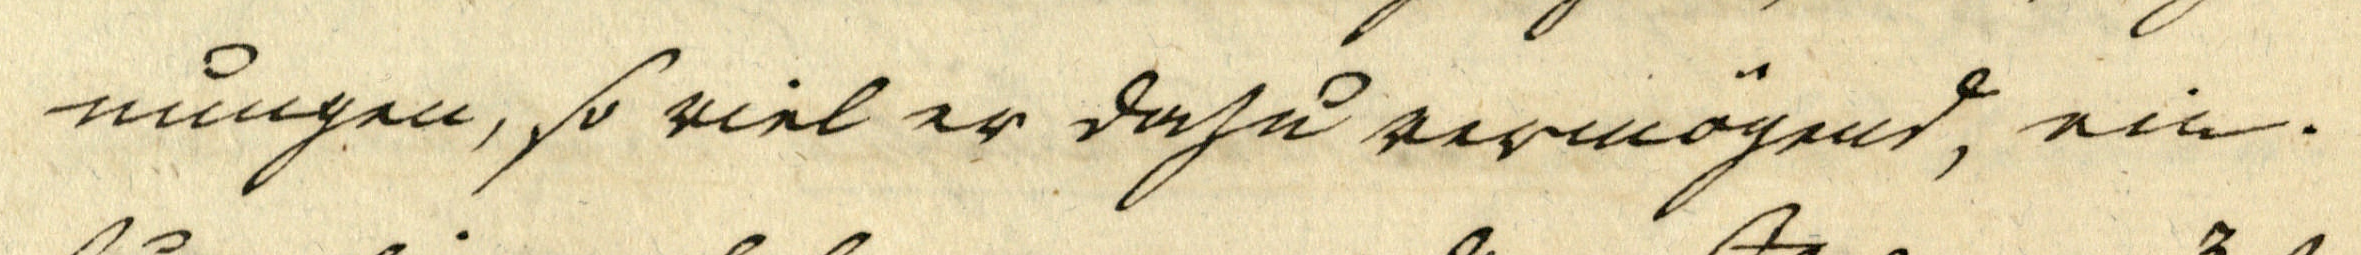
nungen, so viel er dazu vermögend, ein¬
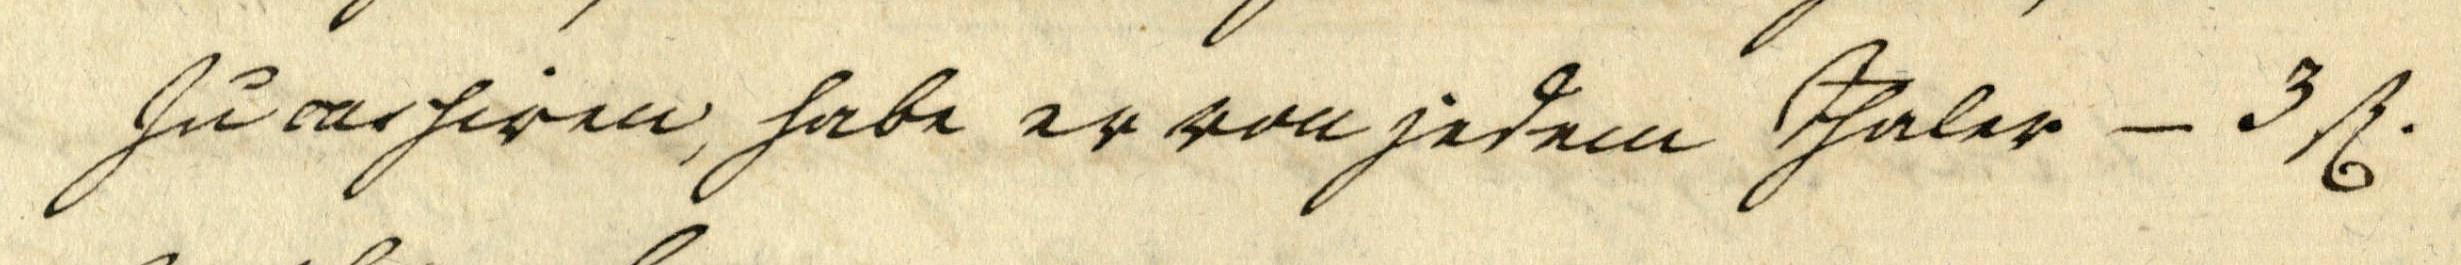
zu cassiren, habe er von jedem Thaler - 3 l .
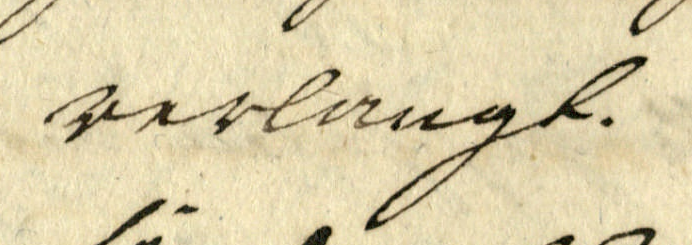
verlangt.
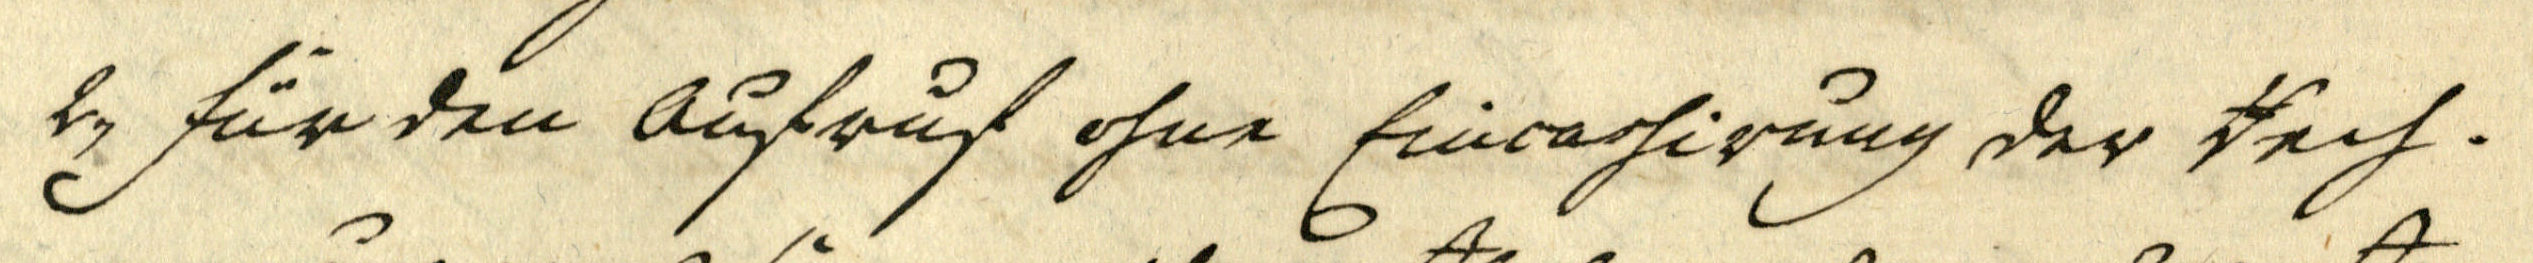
2. für den Aufruf ohne Eincassirung der Rech-
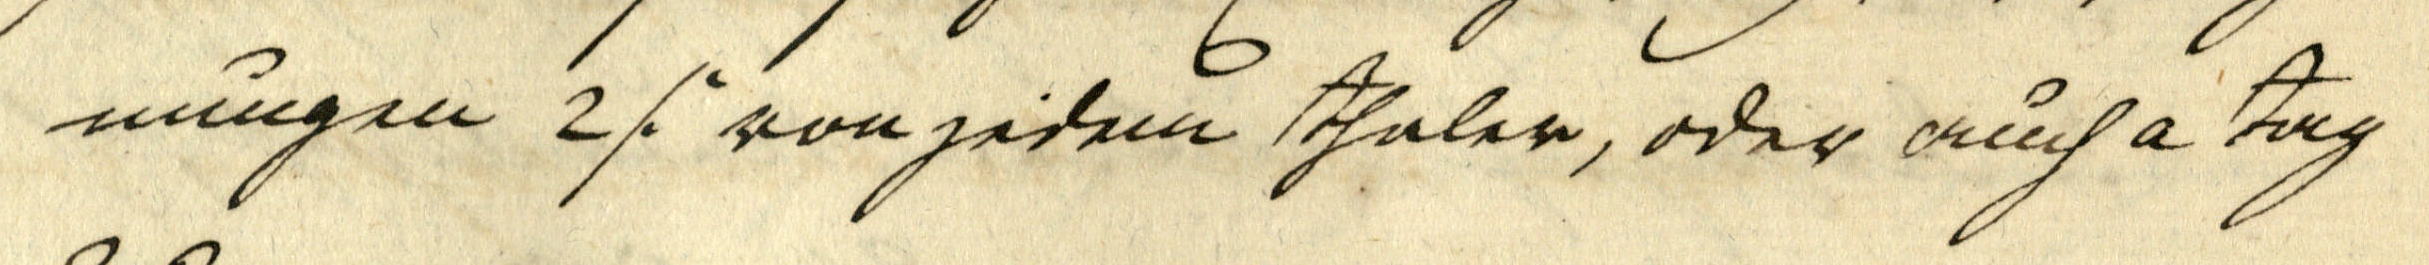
nungen 2 s. von jedem Thaler, oder auch a Tag
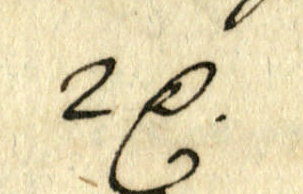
2 l.
